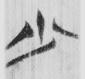少
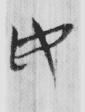女
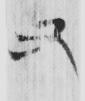又
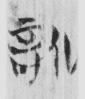訛
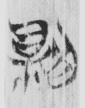則
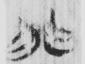非
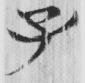子
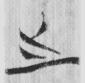之
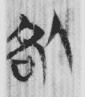咎
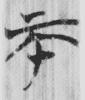帀
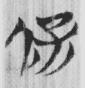保
